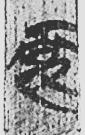妻
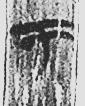于
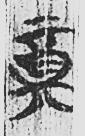奠
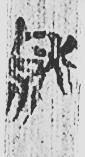穆
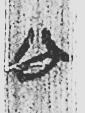公
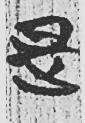是
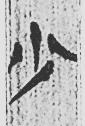少
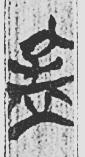{孔皿}
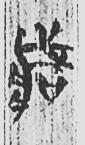戕
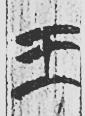王
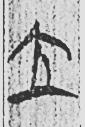立
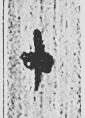十
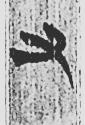又
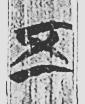五
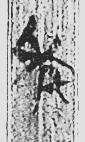年
